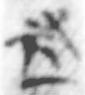○（右）
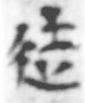徒
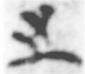之
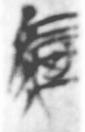騏
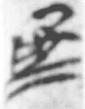爲
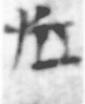○（左）
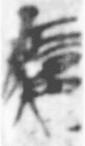驂
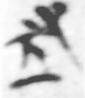○（右）
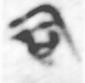司
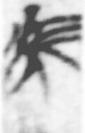馬
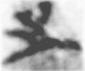之
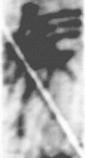駟
